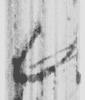㠯（以）
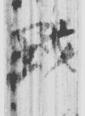{王戈}
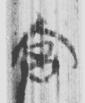宮
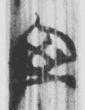室
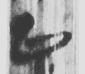㠯（以）
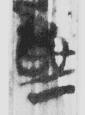爲
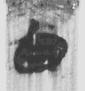目
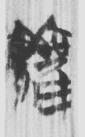觀
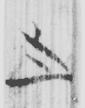之
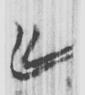亡
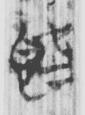既
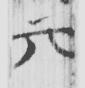亓
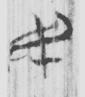民
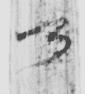乃
